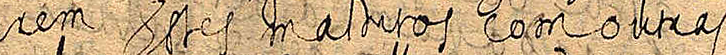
crem Estes malditos com outras
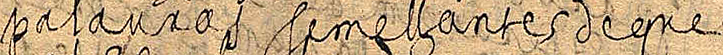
palauras semelhantes de que
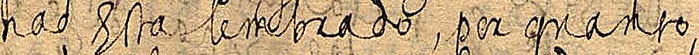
naõ Esta lembrado, por quanto
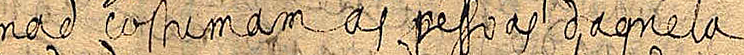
naõ costumam as pessoas daquela
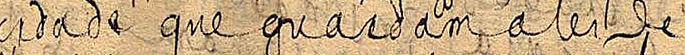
cidade que guardam a lei de
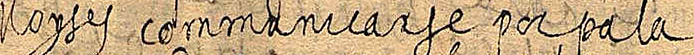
Moyses communicarse por pala
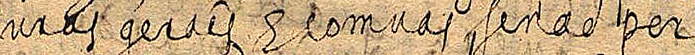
uras geraēs E comuas senaõ per
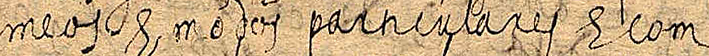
meos E modos particulares E com
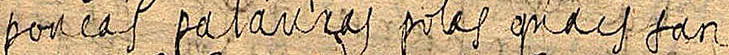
poucas palauras polas quais tan
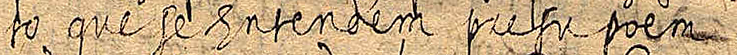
to que se Entendem presupoem
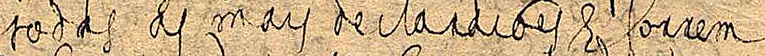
todas as mais declaracões E Correm
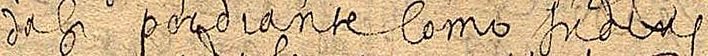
dahi por diante como Judeus
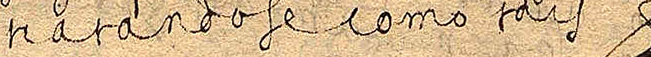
tratandose como tais E
